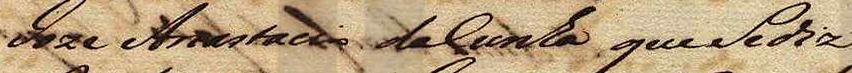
Ioze Anastacio da Cunha que se diz
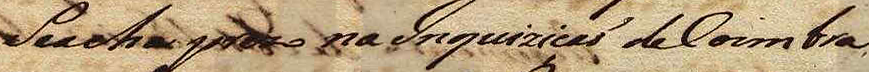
Se acha prezo na Inquiziçaõ de Coimbra
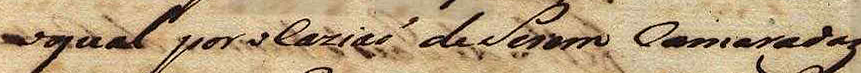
o qual por oCaziaõ de Serem Camaradaz
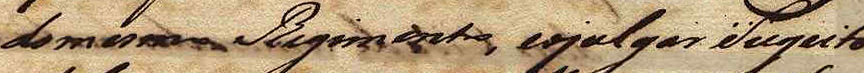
do mesmo Regimento, e o julgar Sugeito
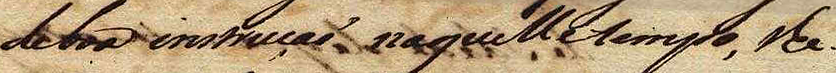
de boa instruçaõ naquelle tempo, lhe
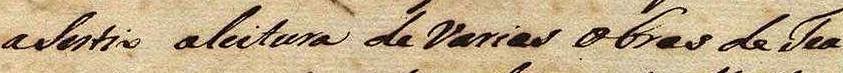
aSestio a leitura de Varias obras de Tea
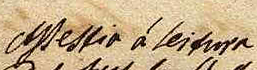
Assestia á Leitura
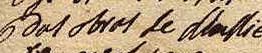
das obras de Mollie
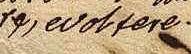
re, e voltere.
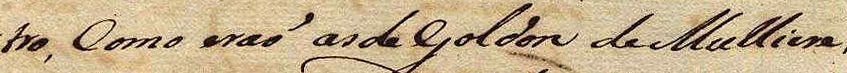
tro, Como eraõ as de Goldon de Mulliere,
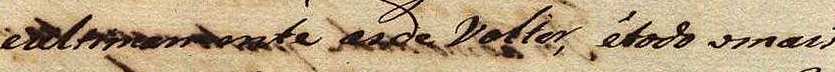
e ultimamente as de Volter, é todo o mais
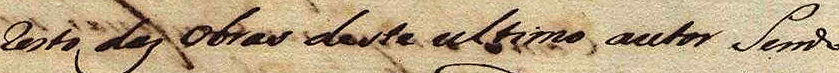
resto daz obras deste ultimo autor Sendo
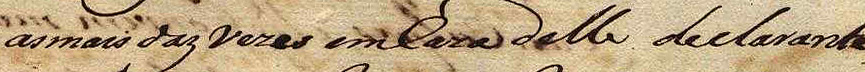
as mais daz vezes em Caza delle declarante,
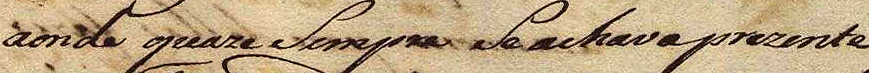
aonde quaze Sempre Se achava prezente
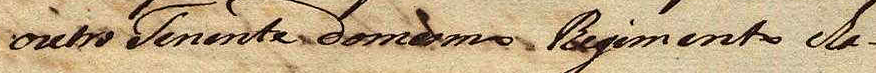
outro Tenente do mesmo Regimento cha
